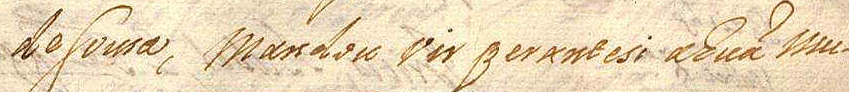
de Sousa, mandou vir perante si a huā mu
